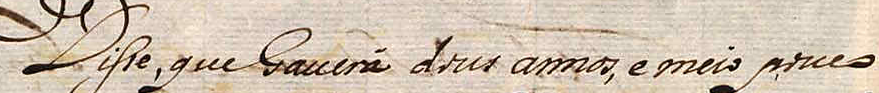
Disse, que hauerá dous annos, e meio pouco
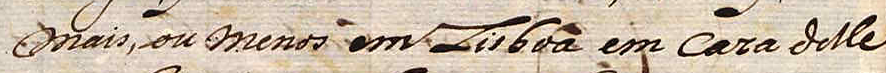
mais, ou menos em Lisboa em caza delle
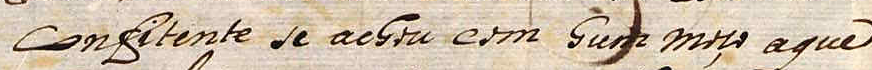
confitente se achou com hum moço a que
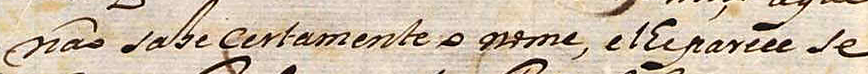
não sabe certamente o nome, e lhe parece se
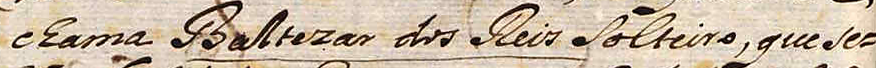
chama Baltezar dos Reis solteiro, que se
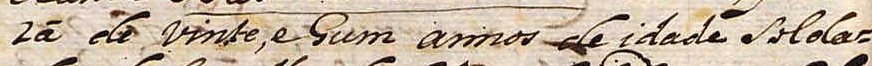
rá de vinte, e hum annos de idade solda
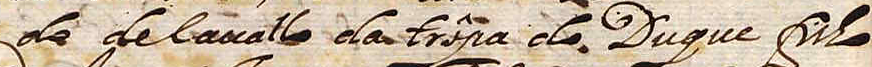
do de Cauallo da tropa do Duque filho
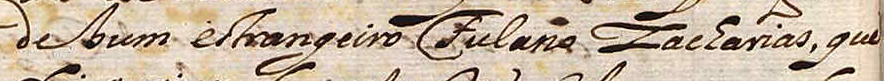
de hum estrangeiro Fulano Zacharias, que
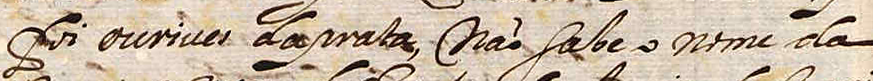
foi ouriues da prata, naõ sabe o nome da
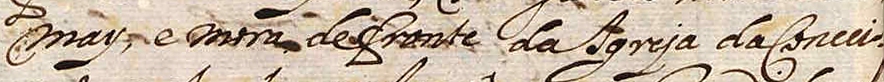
may, e mora defronte da Igreja da Concei
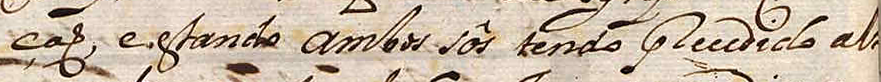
çaõ, e estando ambos sós tendo precedido al
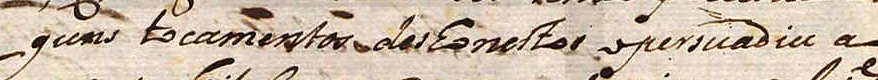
guns tocamentos deshonestos o persuadiu a
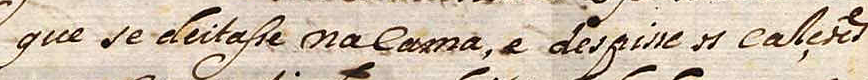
que se deitasse na cama, e despisse os calçoẽs
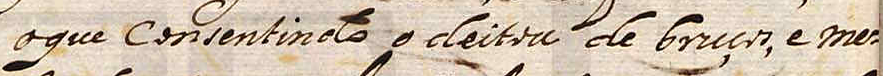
o que consentindo o deitou de bruços, e me
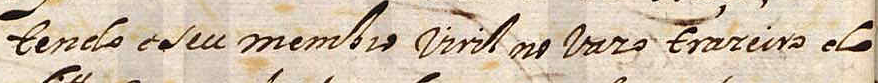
tendo o seu membro viril no vazo trazeiro do
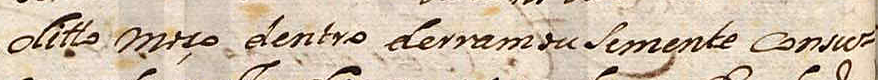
ditto moço dentro derramou semente consu
